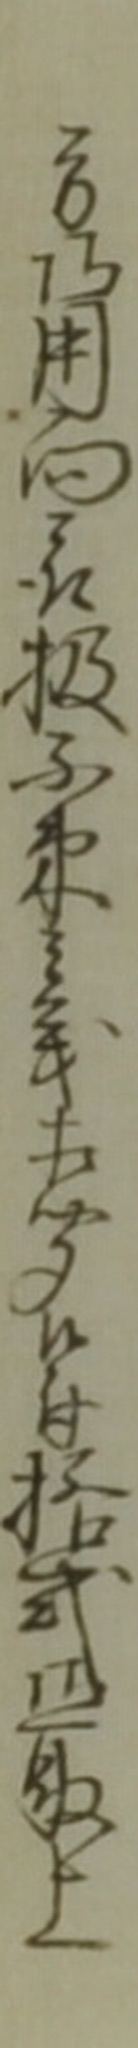加御用向取扱不束之義相聞候付格式御取上
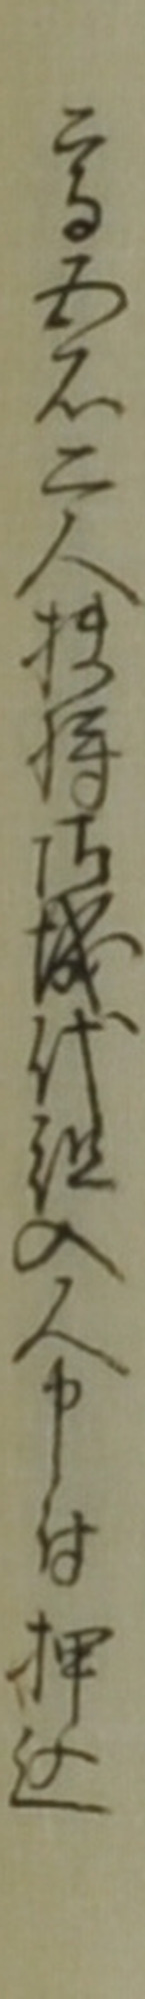高五石二人扶持御城代組入人申付押込
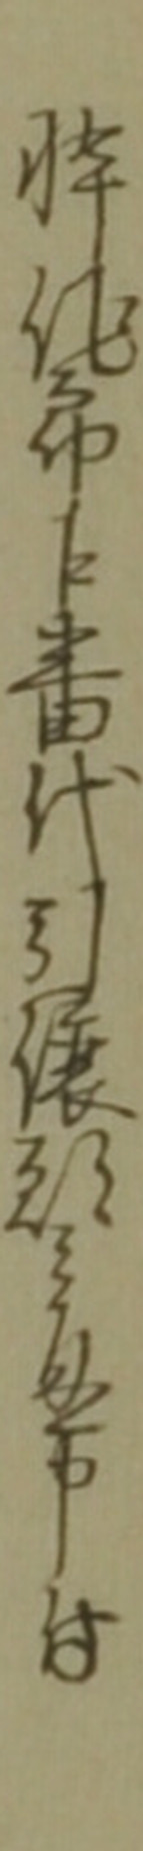忰作郎江番代引譲願之通申付
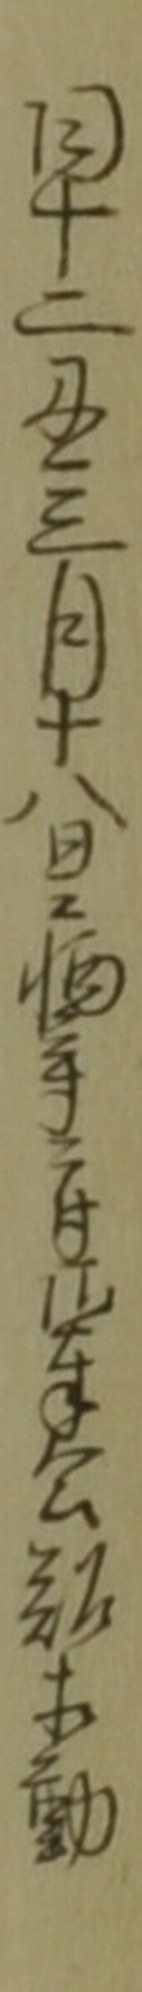一同十二丑三月十八日病気ニ付御奉公難相勤
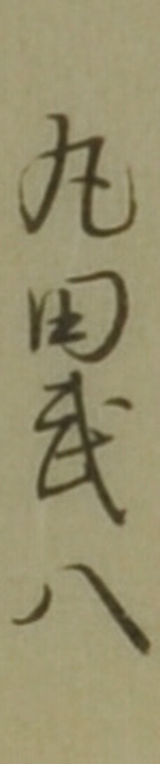丸田武八
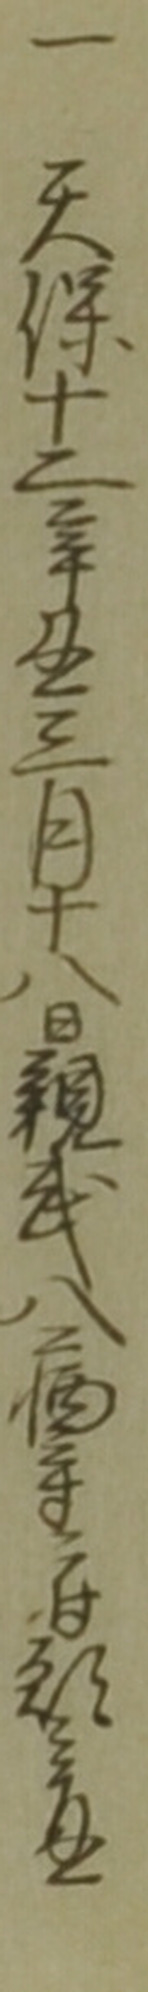一天保十二辛丑三月十八日親武八病気ニ付願之通
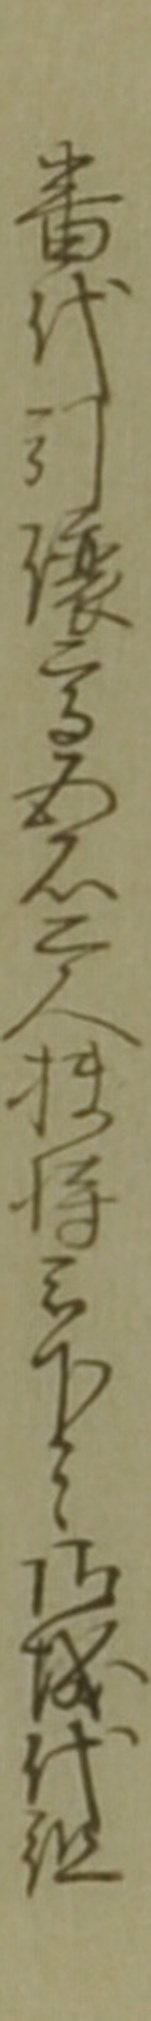番代引譲高五石二人扶持被下之御城代組

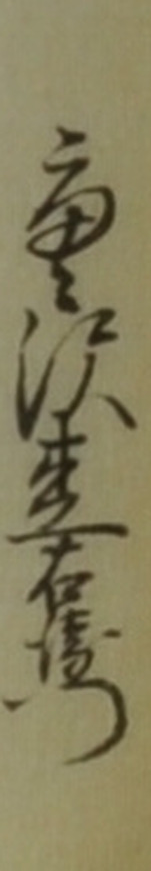唐沢杢右衛門
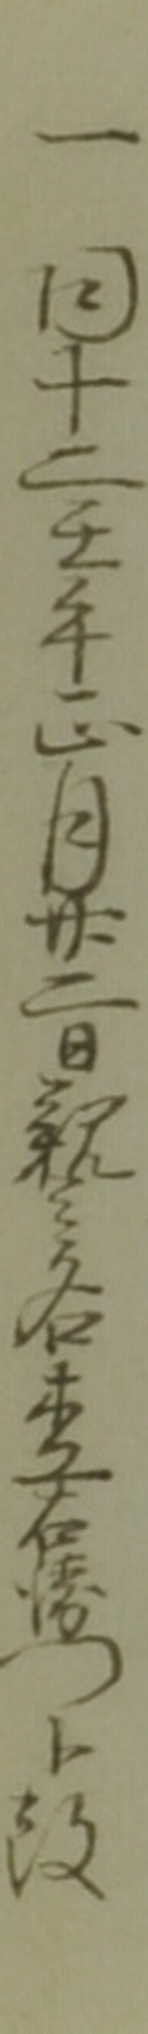一同十二壬午正月廿二日親之名杢右衛門ト改
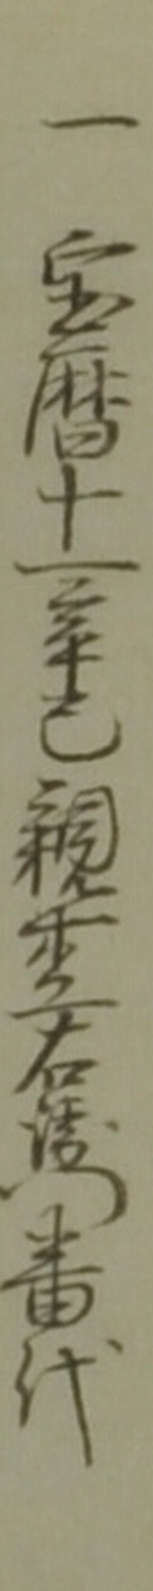一宝暦十一辛巳親杢右衛門番代
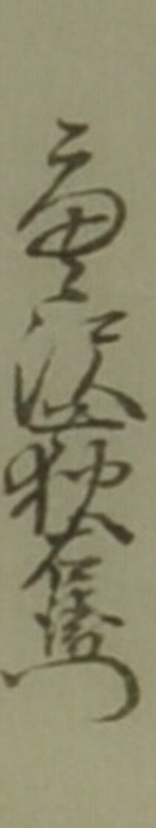唐沢荻右衛門
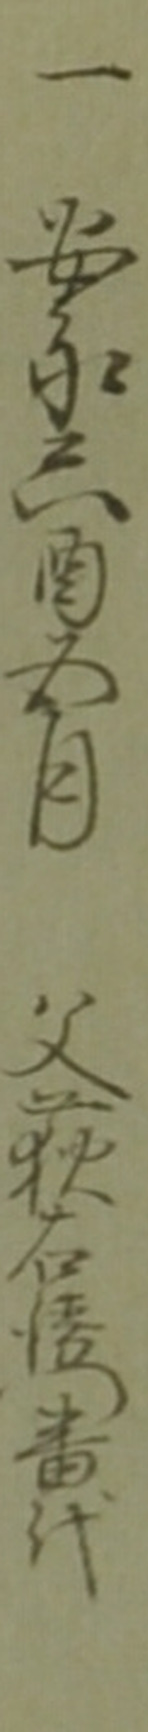一安永六酉五月父荻右衛門番代
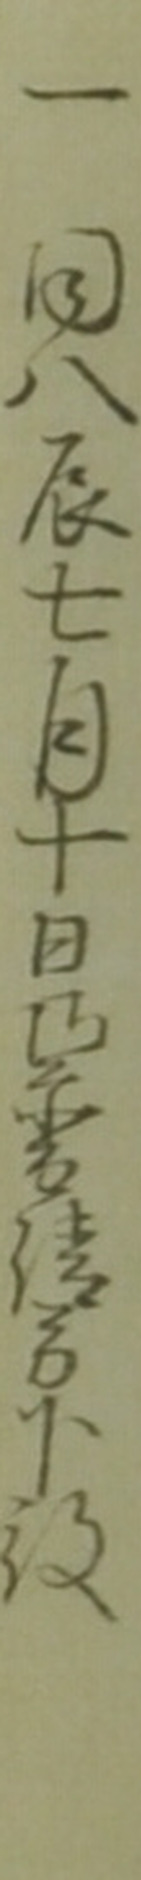一同八辰七月十日御普請方下役
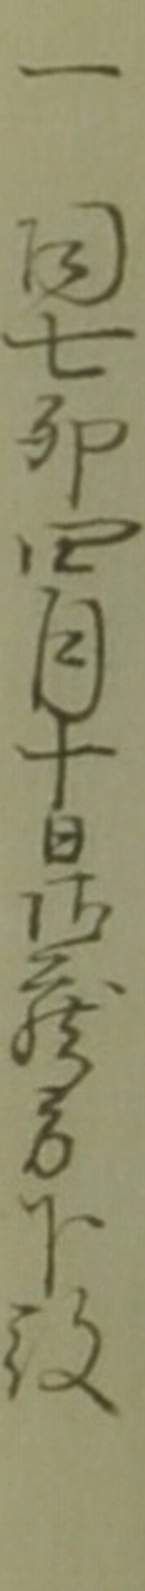一同七卯四月十日御蔵方下役
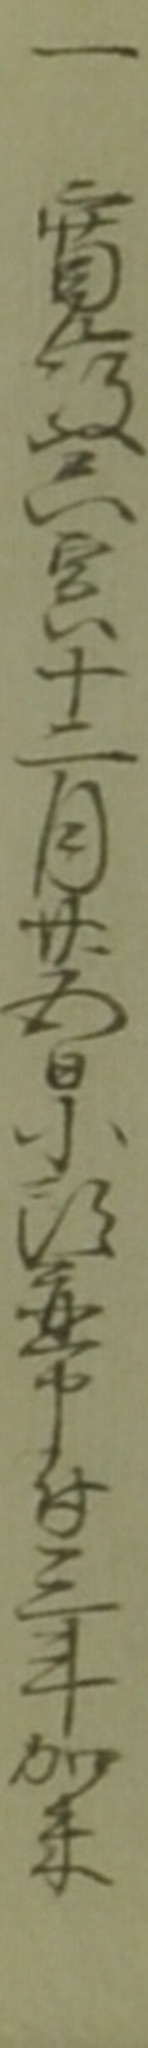一寛政六寅十二月廿五日小頭並申付三斗加米
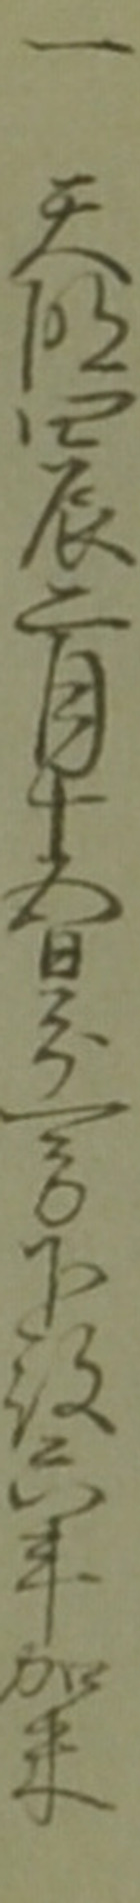一天明四辰二月十五日分一方下役六斗加米
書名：無足諸士勤仕録（九）
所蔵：伊那市立高遠町図書館・合同会社AMANE
